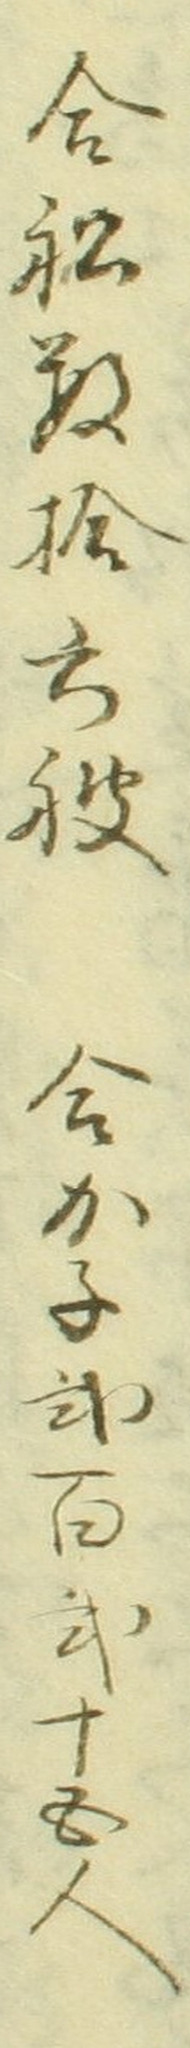合船数拾六艘合加子弐百弐十五人
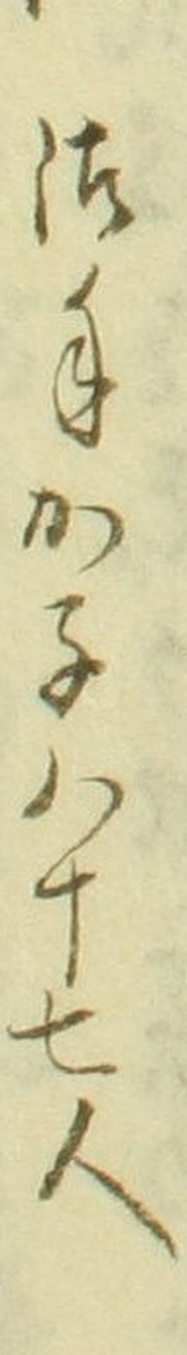内御手加子八十七人
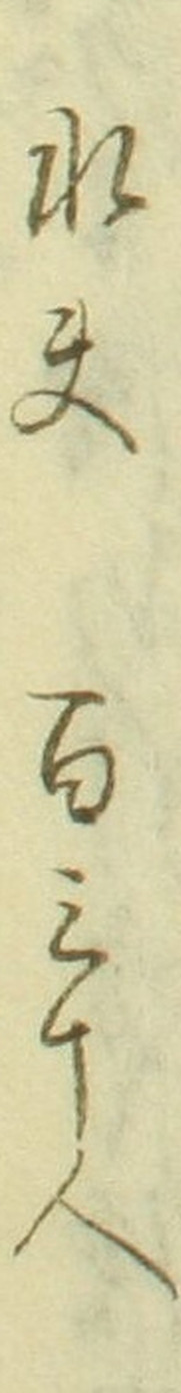水夫百三十人
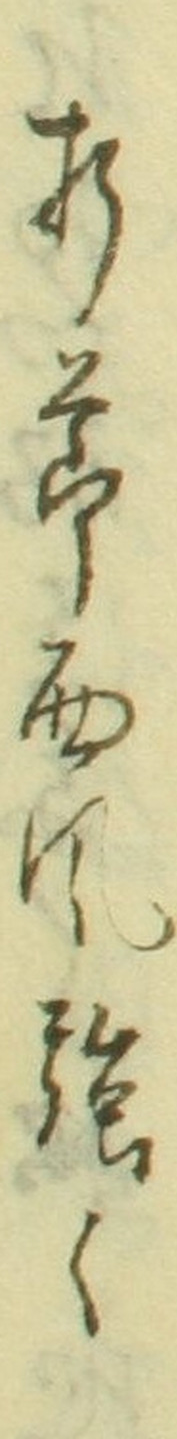折節西風強く
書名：唐船漂流記 四
